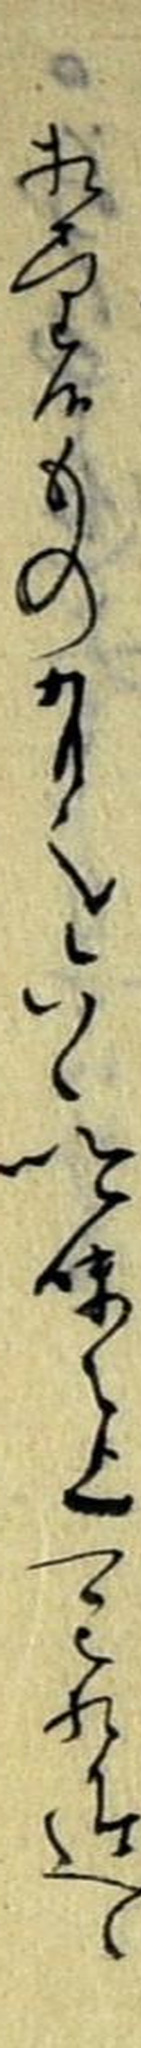相望候もの有之候ハヽ吟味之上可被相達候

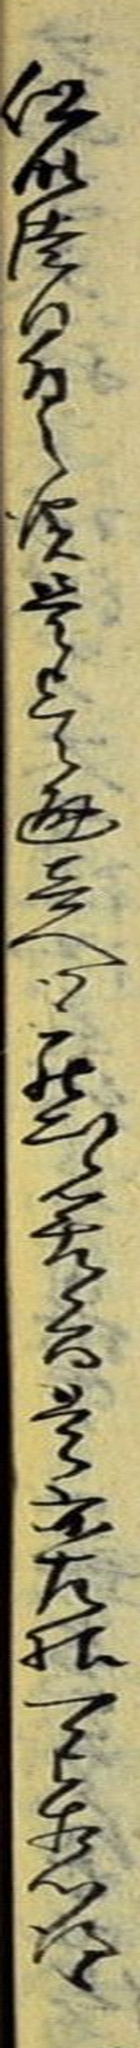但御徒目付之儀ハ是迄之通壱人ツヽ罷出候筈候間是亦左様可被相心得候

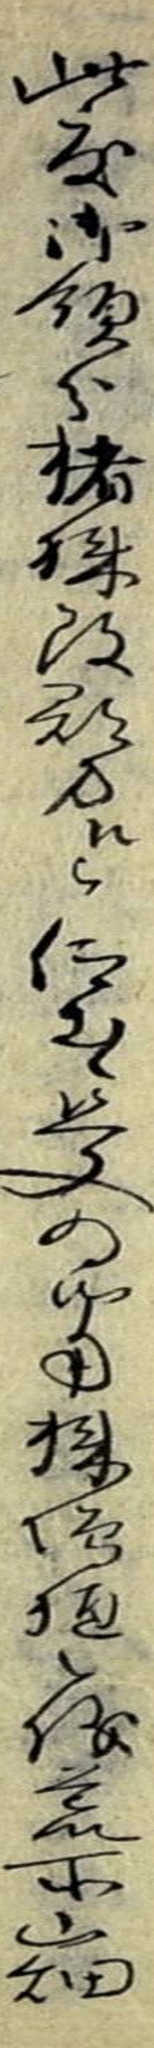此度御領分楮株改郡方江被仰出候且又為御用株増殖之儀荒所山畑
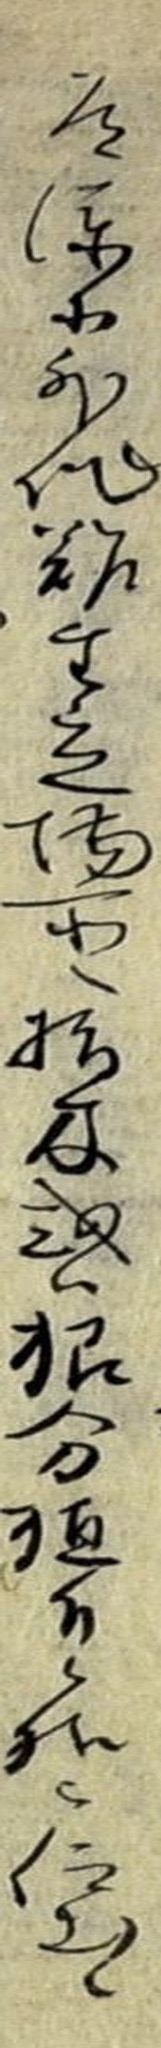道添等外作難生立場所へ指木或ハ根分植付候様被仰出候
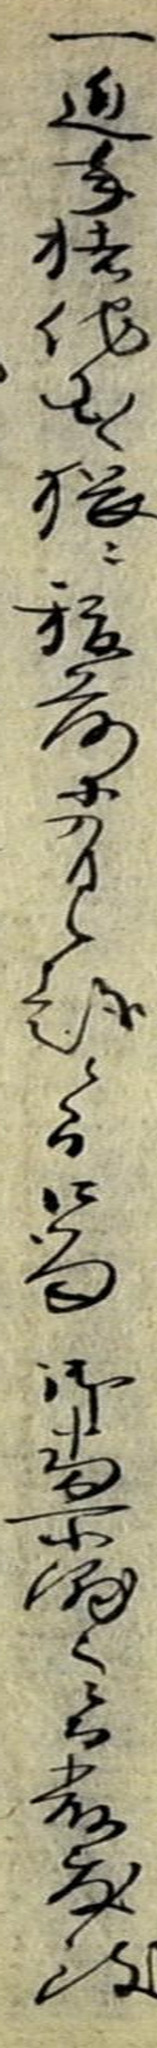一近年楮他国へ猥ニ抜荷等有之趣候間口留御番所浦々ニ而厳敷致
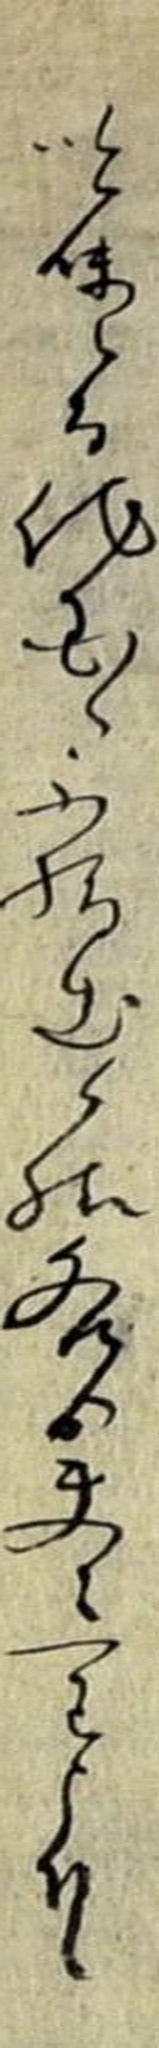吟味候而他国へ不指出候様各ゟ夫々可被申付候
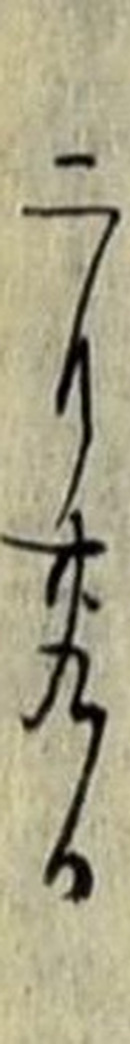二月廿九日
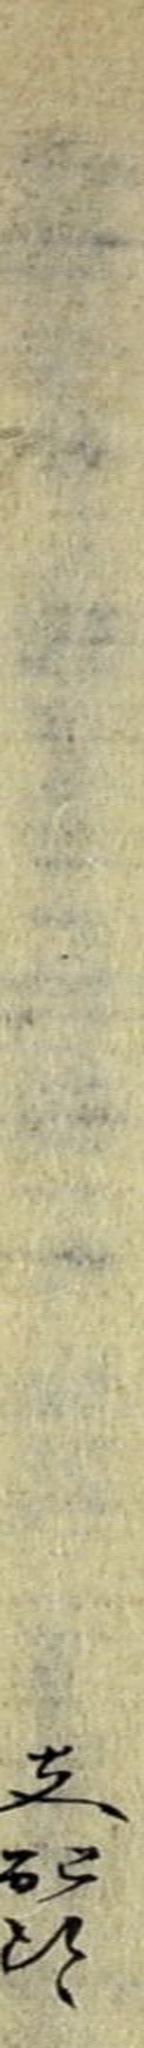支配頭へ
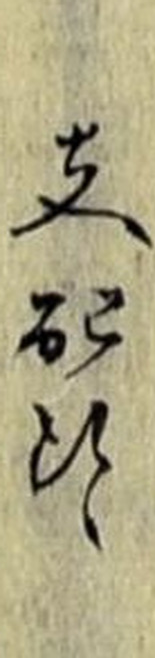支配頭へ
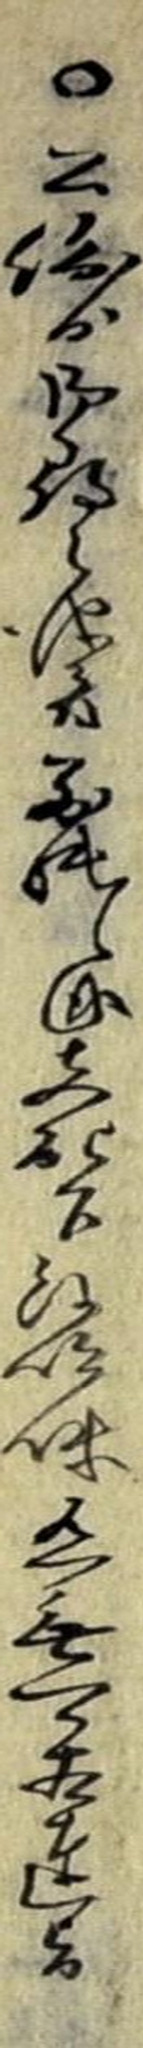〇公儀ゟ御尋之儀ニ付別紙之通支配下致吟味有無可相達旨
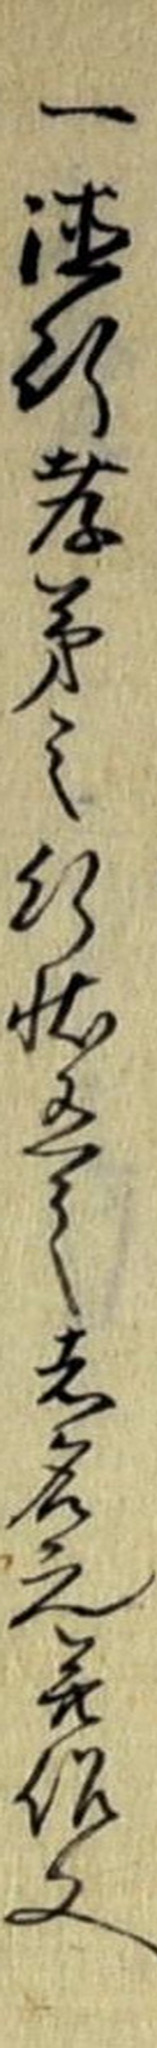一徳行孝弟之行状有之者名元并作文
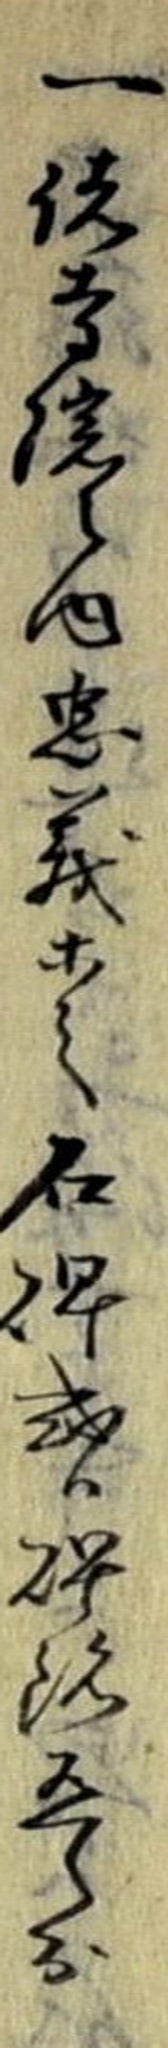一諸寺院之内忠義等之石碑或ハ碑銘有之分
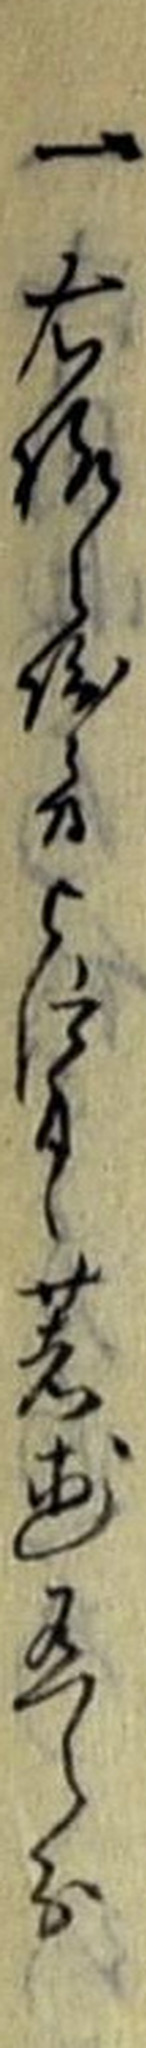一右様之儀ニ付被仰付候著述有之分
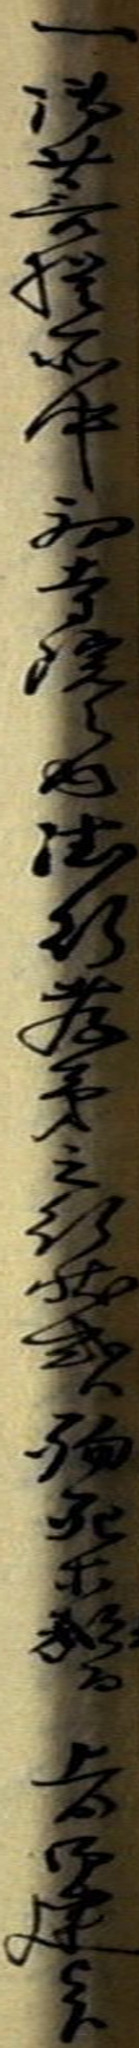一御菩提所中初寺院之内徳行孝弟之行状或ハ殉死等都而上ゟ御建被下
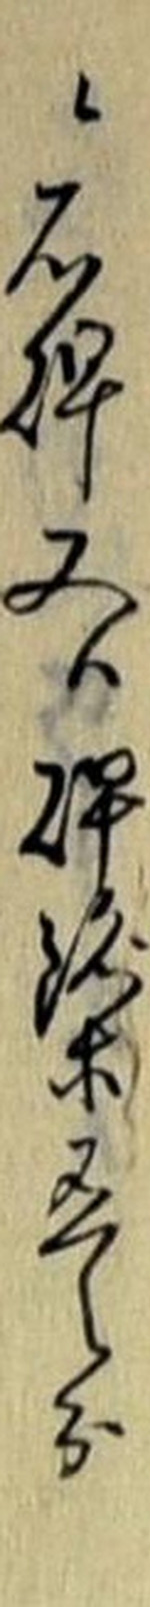候石碑又ハ碑銘等有之分
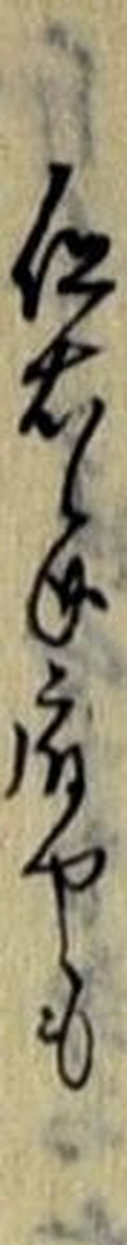但右之趣府中へも
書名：命令之部 三
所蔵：福井県文書館 Fukui Prefectural Archives
